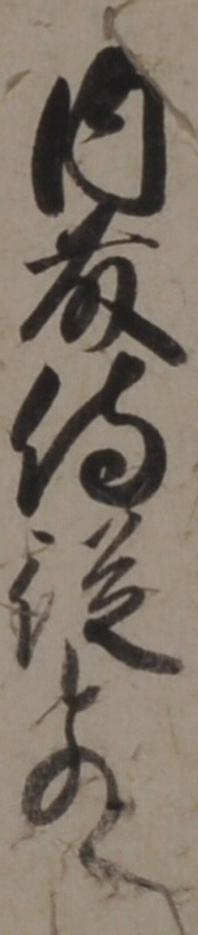内藤侍従とのへ
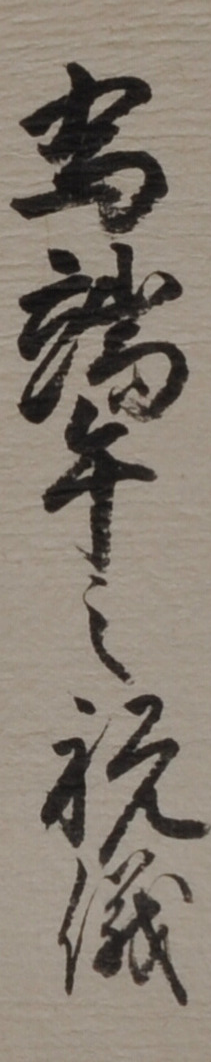為端午之祝儀
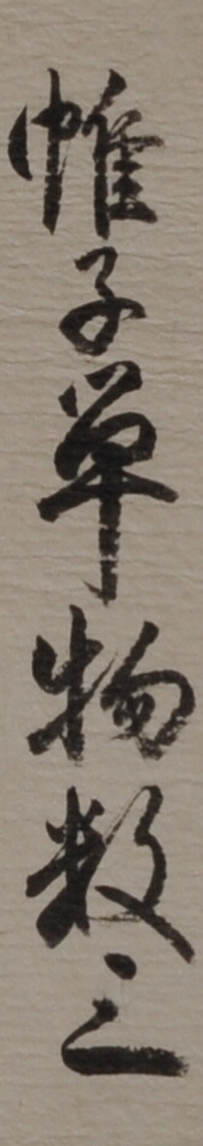帷子単物数三
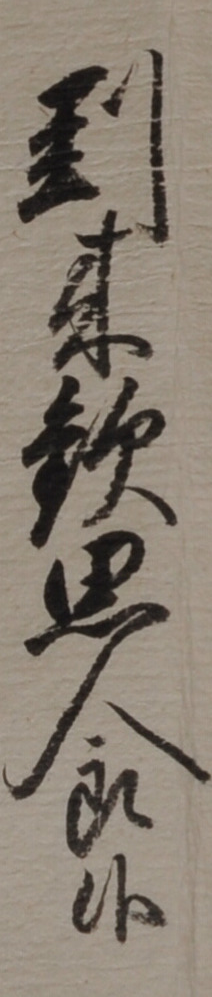到来歓思食候
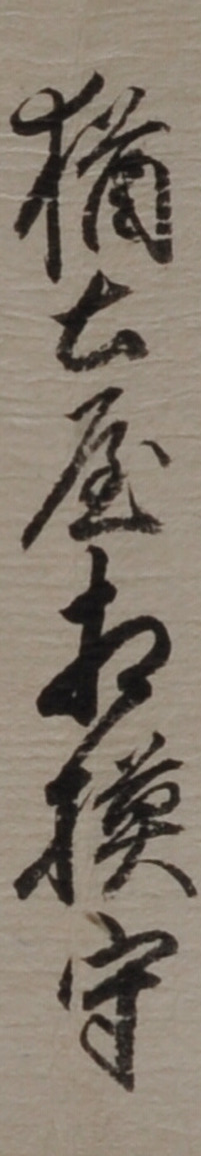猶土屋相模守
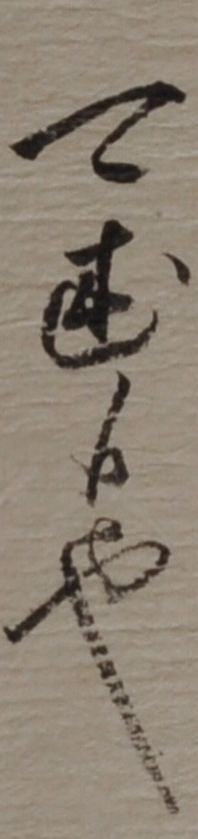可述候也
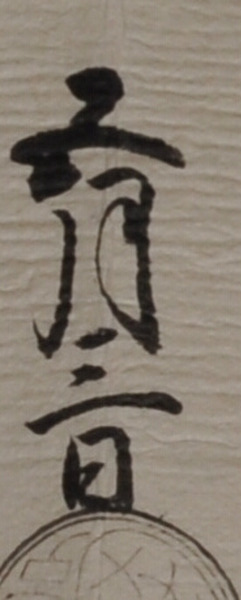五月三日
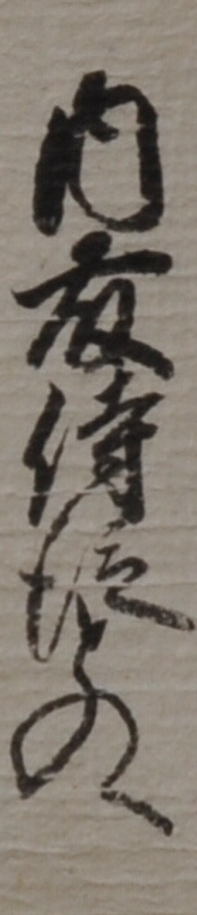内藤侍従とのへ
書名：御内書
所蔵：伊那市立高遠町図書館・合同会社AMANE
